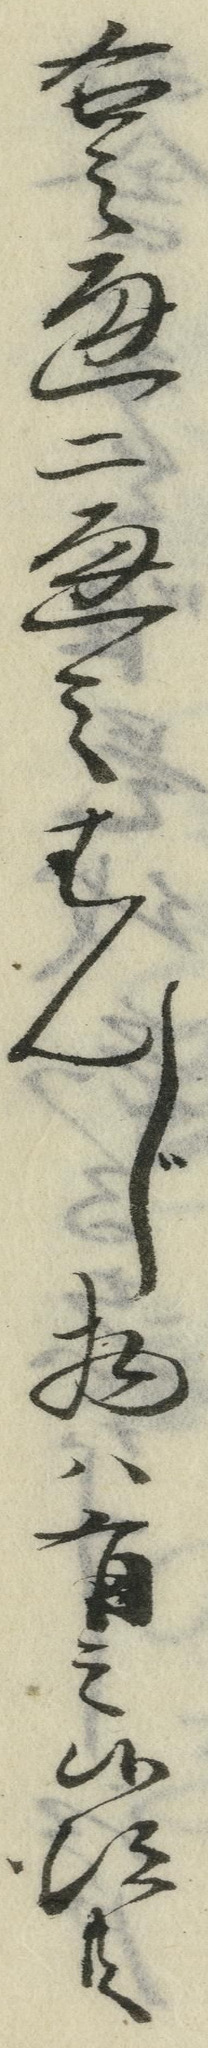右之通二通之はんじ物は有之候得共

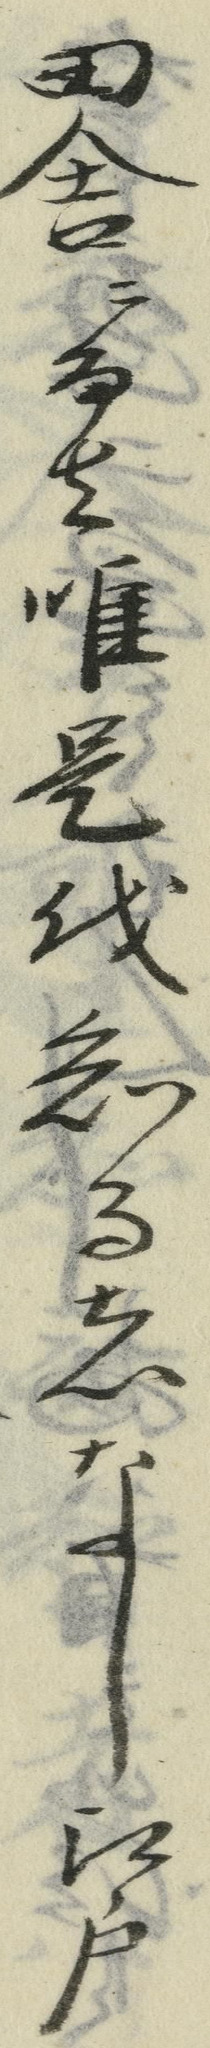田舎ニ而は唯是を知る者なし江戸
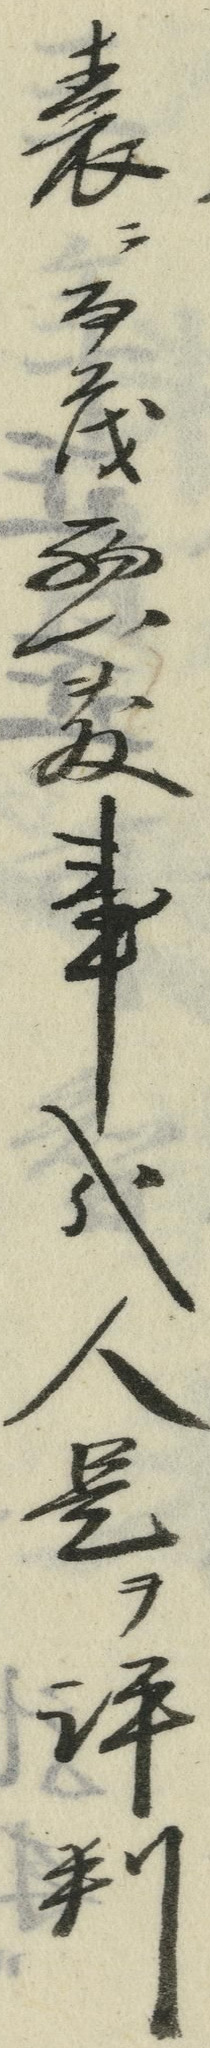表ニ而茂悪敷事哉人是ヲ評判
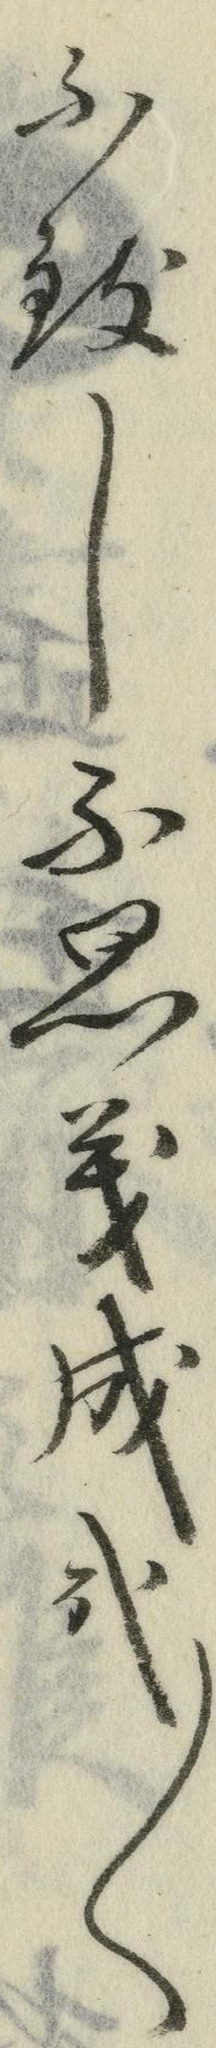不致候不思義成哉〳〵
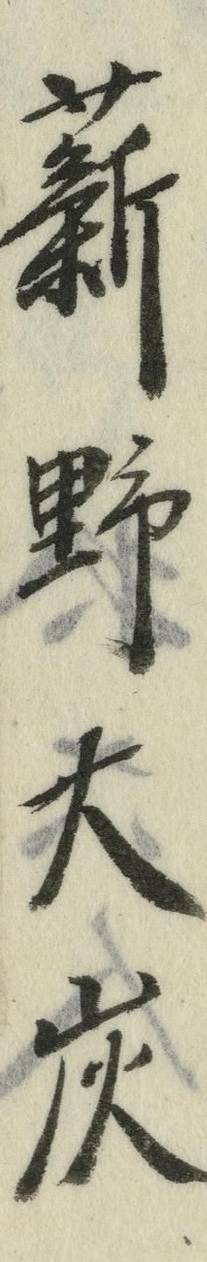薪野大炭
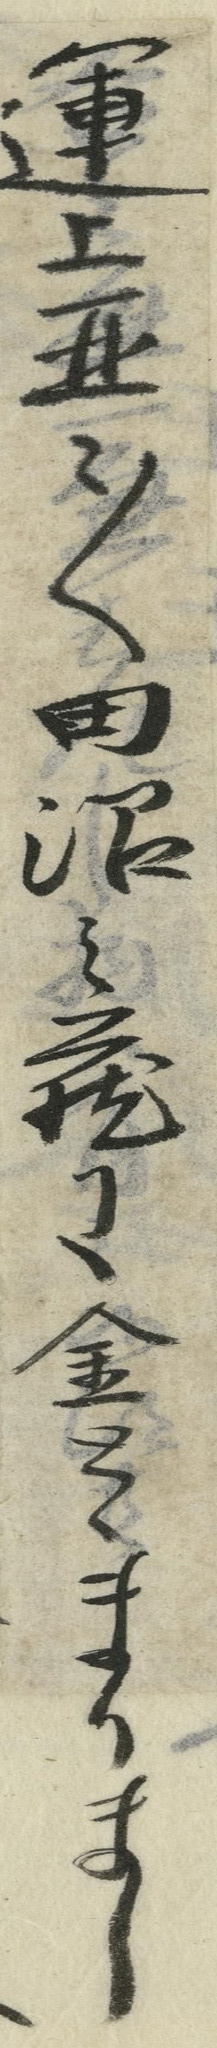運上並々〳〵田沼之蔵に金とゝまりまし
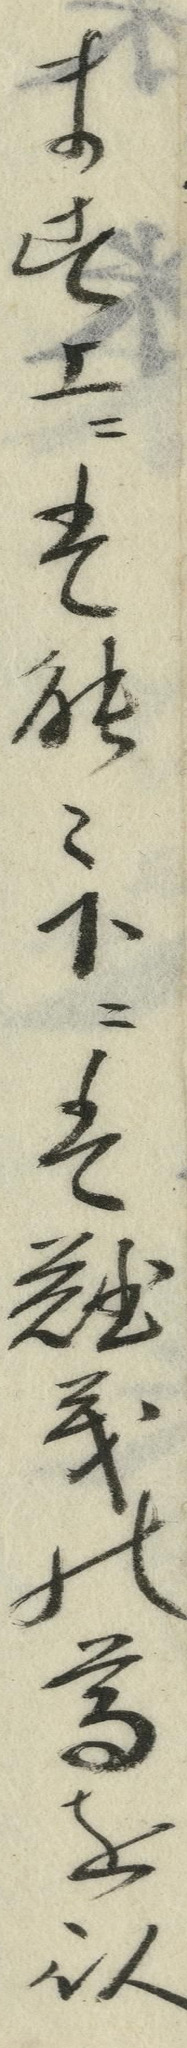ます上ニは能々下ニは難義の尊【噂カ）を以
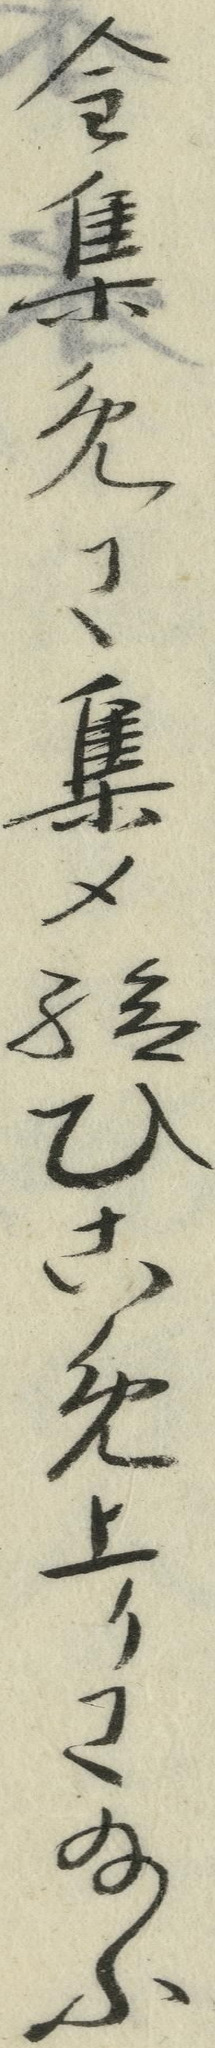金集めに集メ給ひこめ上リに給ふ
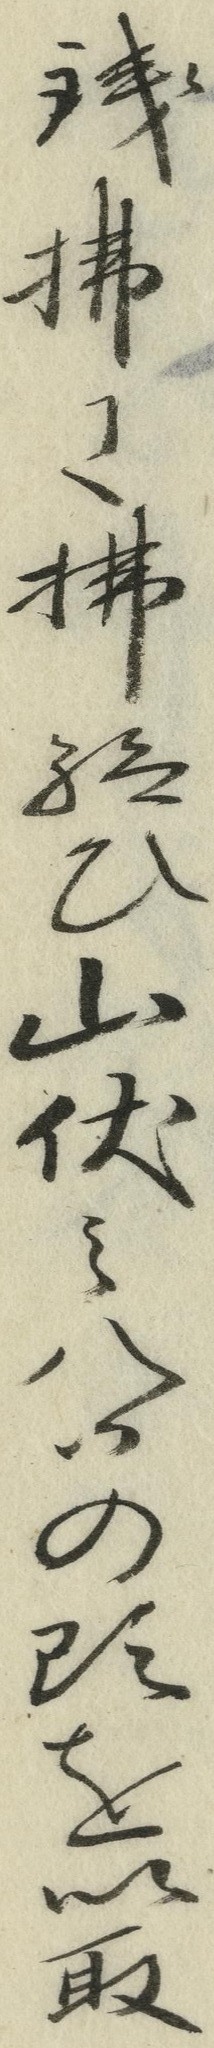銭払に払給ひ山伏之八ツの頭を以取
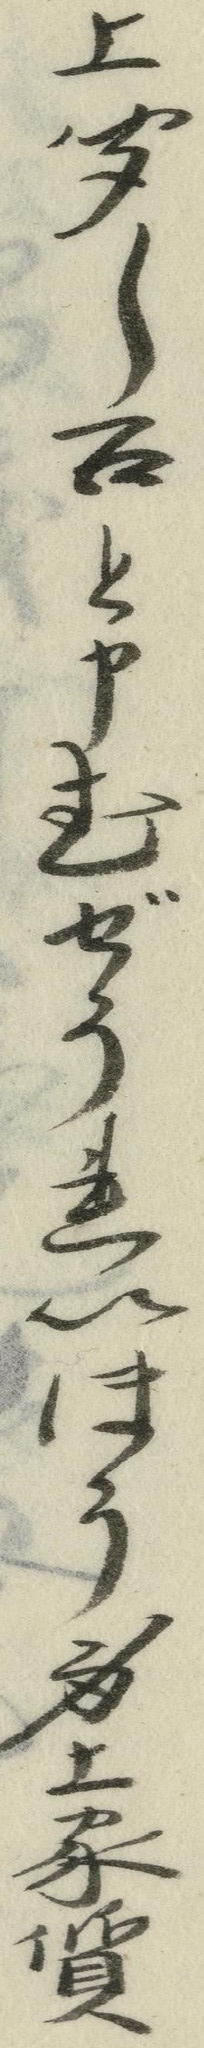上聞し召と申むゼうれいほう身上家質
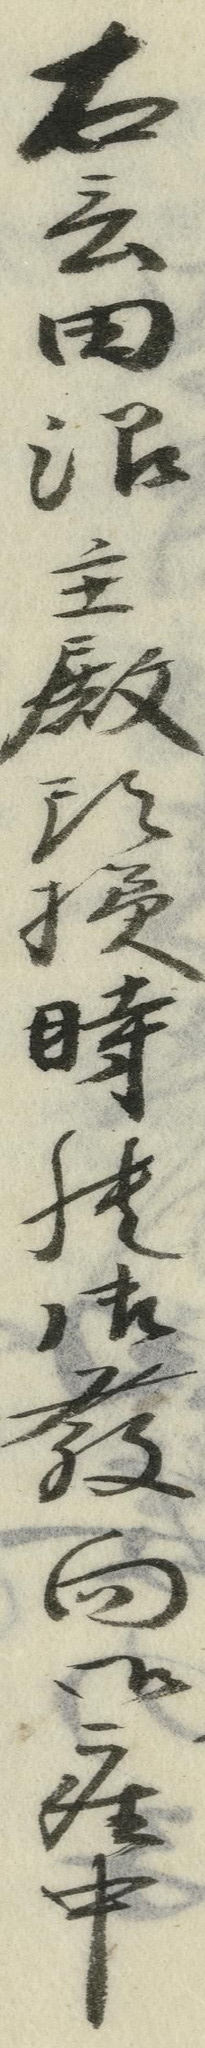右言田沼主殿頭様時の御発向御座中
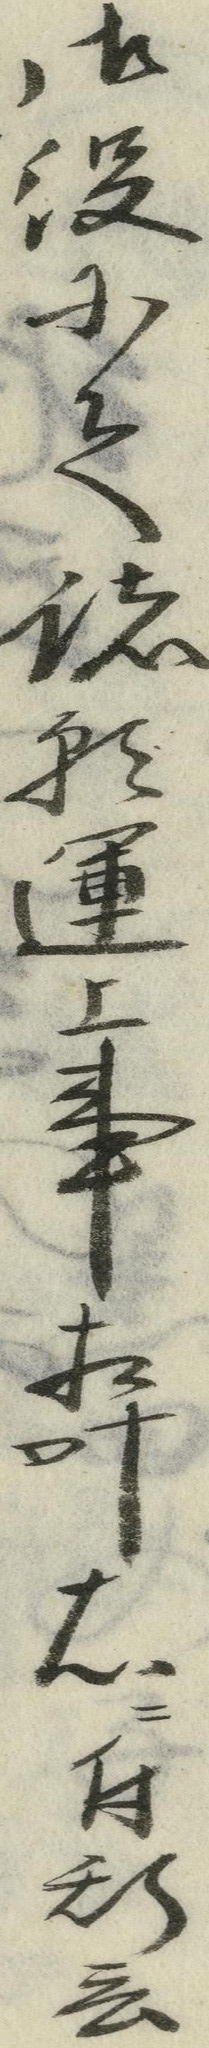御役にて諸願運上事相叶右ニ付斯言
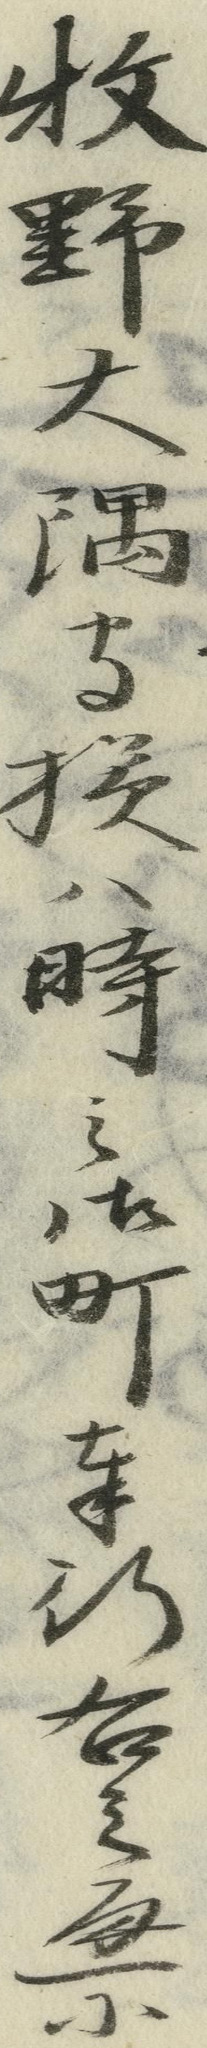牧野大隅守様は時之御町奉行右之通に
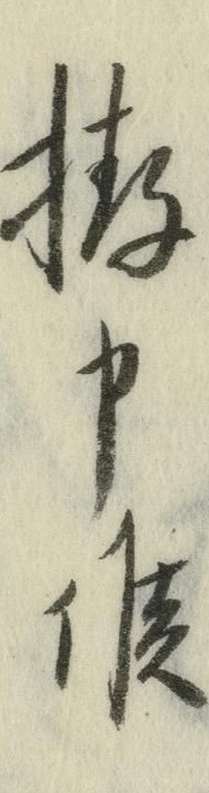拵申候
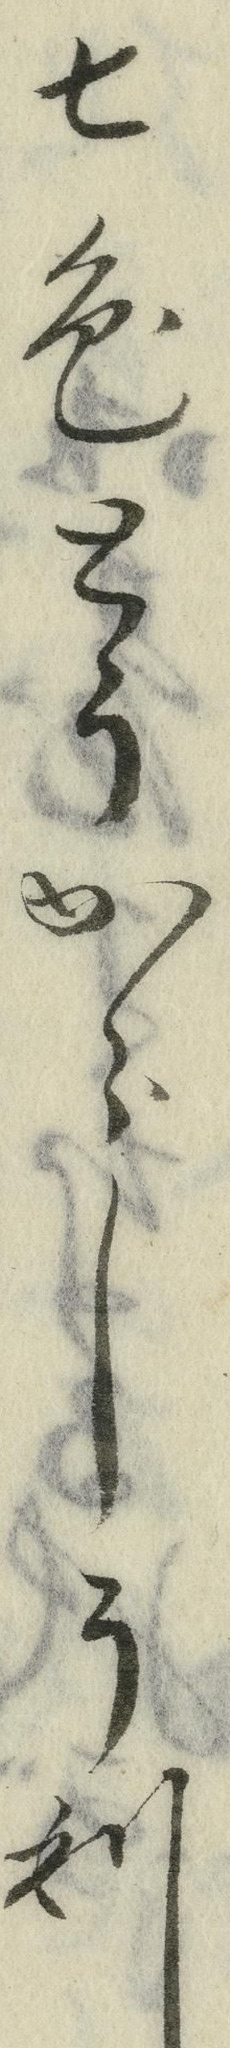七色とうからしう利
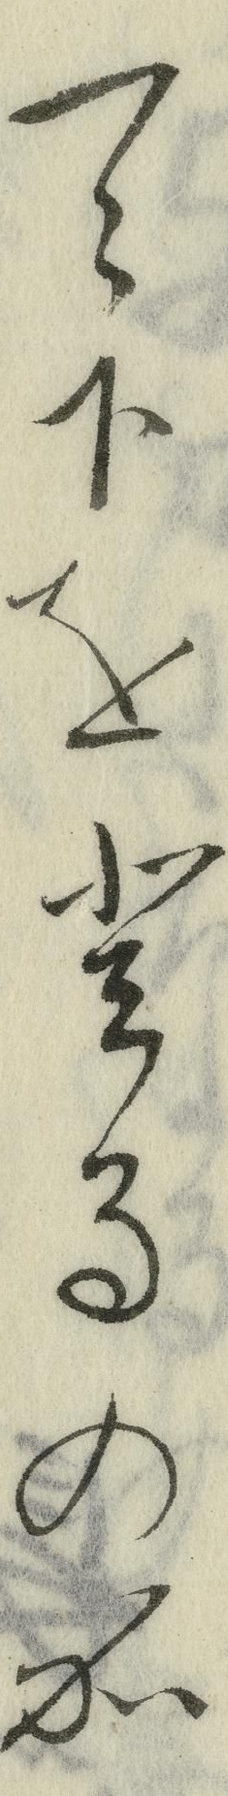天下をとるのか
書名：天明三癸卯七月信州浅間山焼出シ上州山津浪ニ付近國ヨリ御届書并訴書写
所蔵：東京大学地震研究所図書室 Earthquake Research Institute Library, The University of Tokyo, JAPAN
